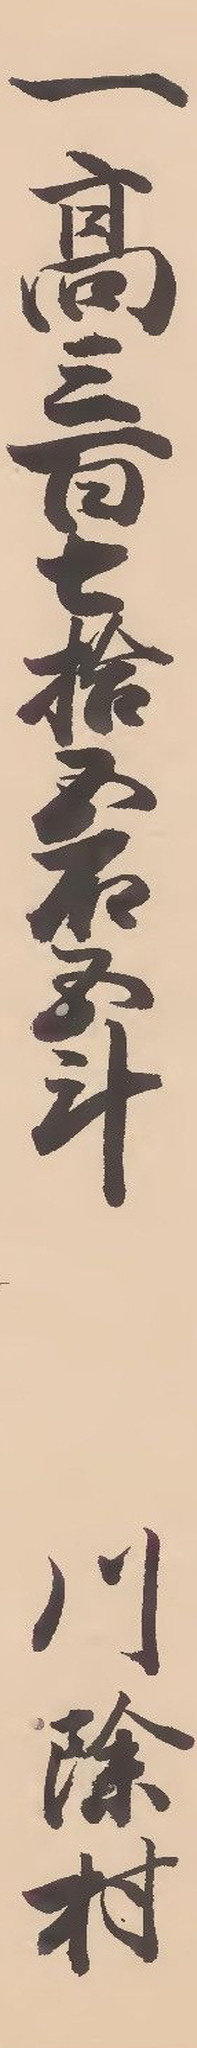一高三百七拾五石五斗川除村
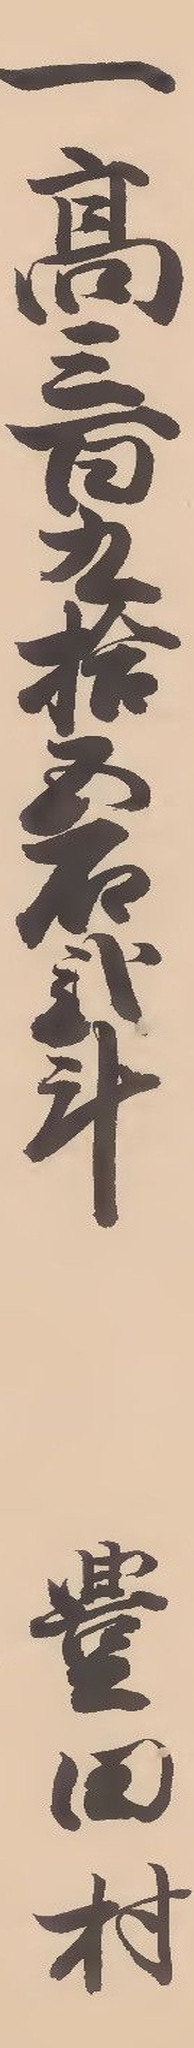一高三百九拾五石弐斗豊田村
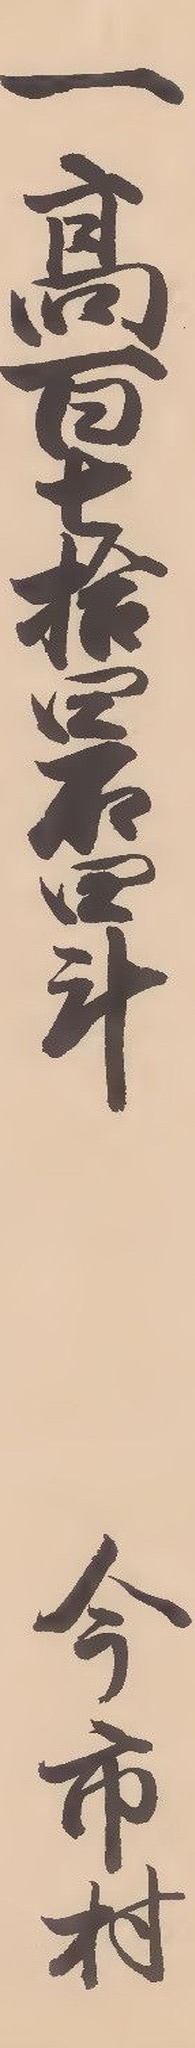一高百七拾四石四斗今市村
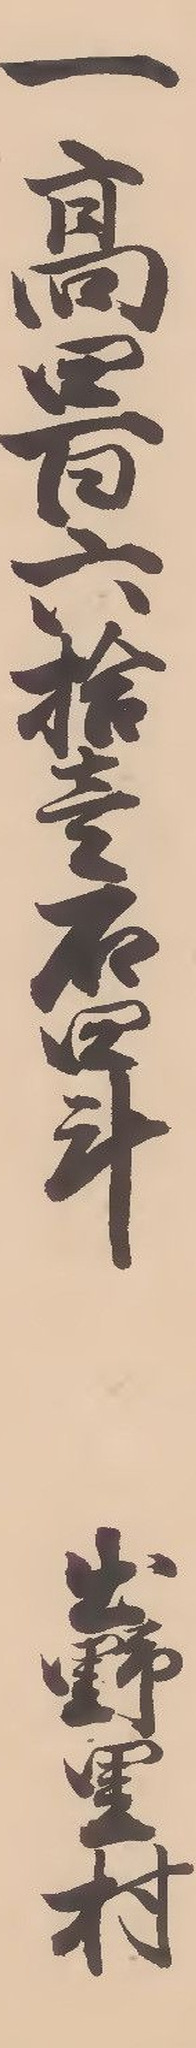一高四百六拾壱石四斗出野里村

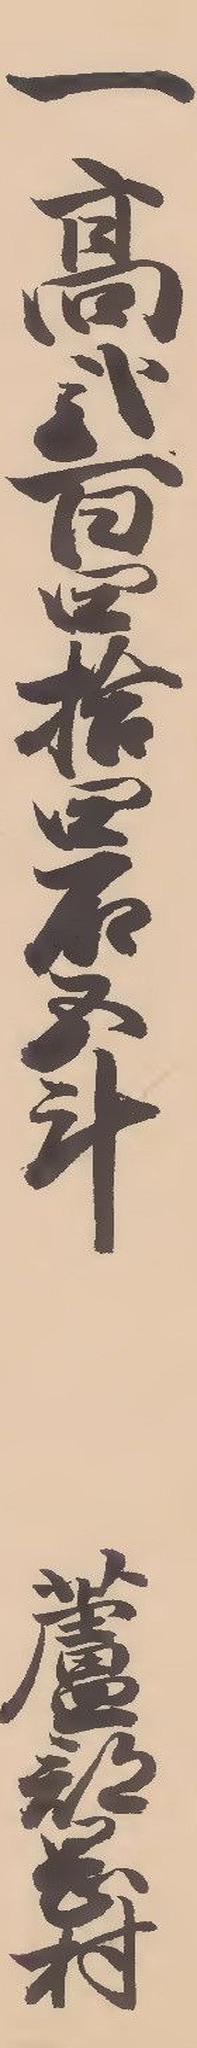一高弐百四拾四石五斗芦部岡村
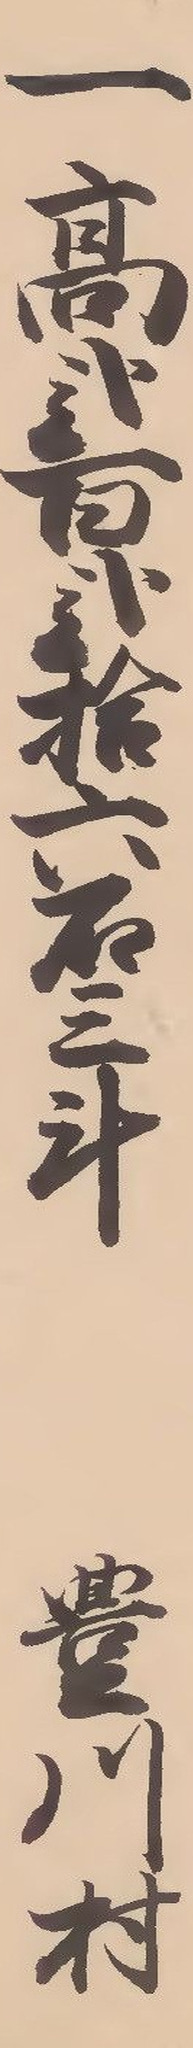一高弐百弐拾六石三斗豊川村
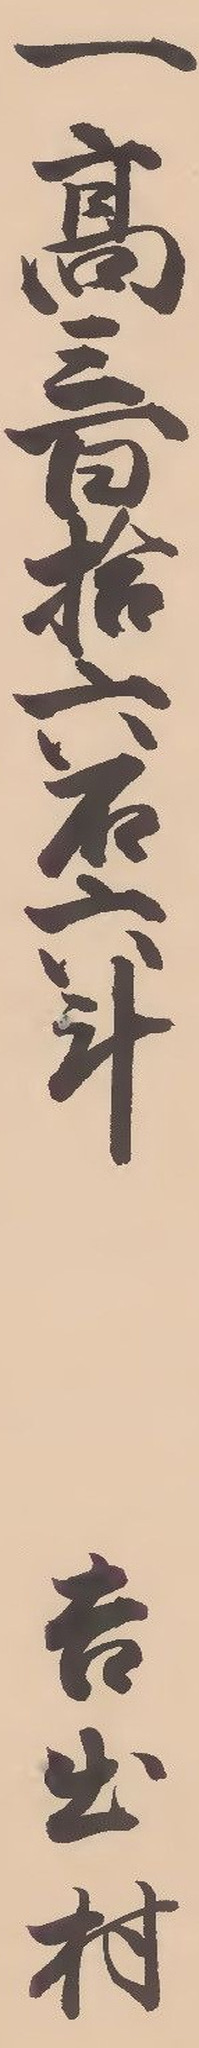一高三百拾六石六斗吉出村
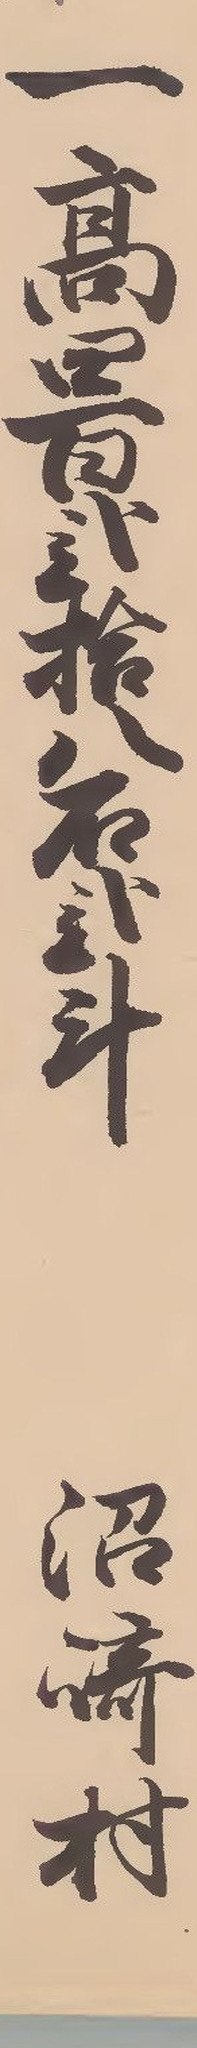一高四百弐拾八石弐斗沼崎村
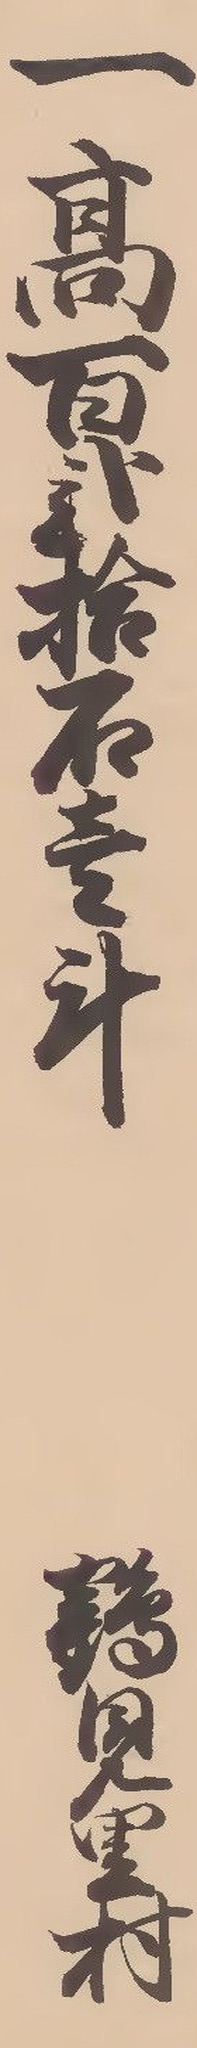一高百弐拾石壱斗鶴見里村

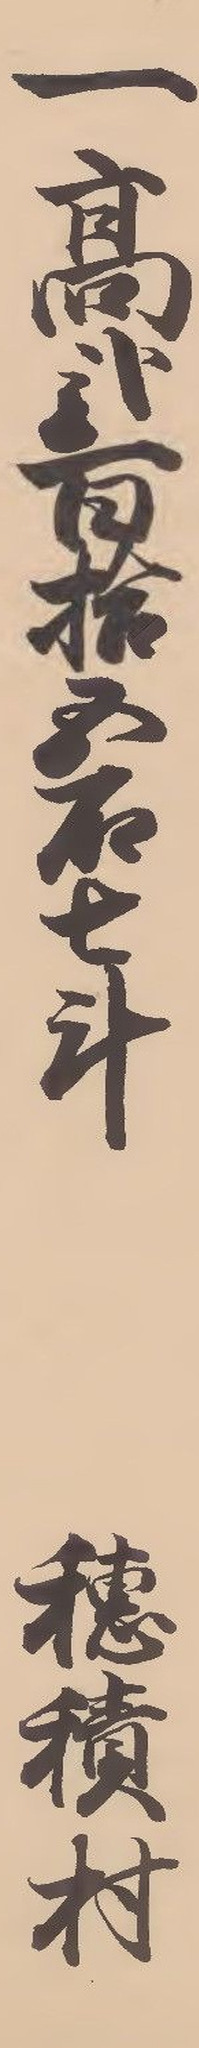一高弐百拾五石七斗穂積村
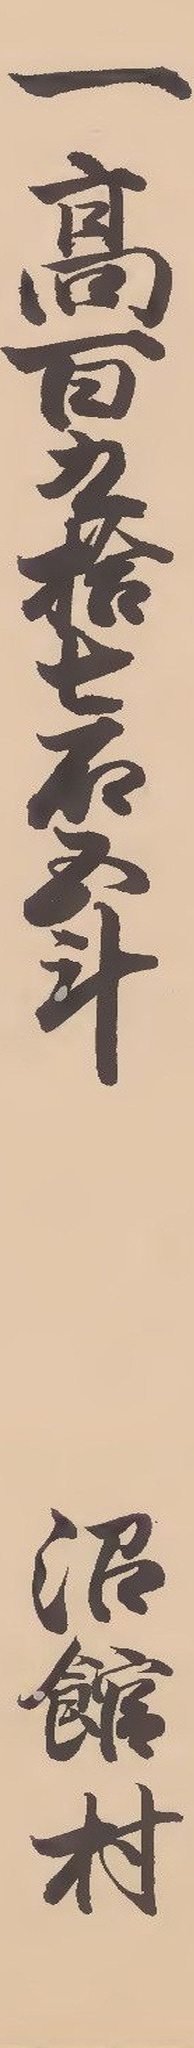一高百九拾七石五斗沼館村
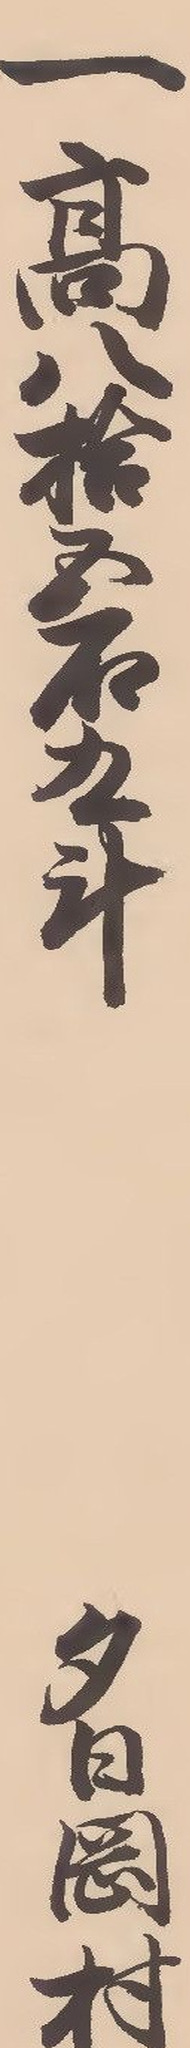一高八拾五石九斗夕日岡村
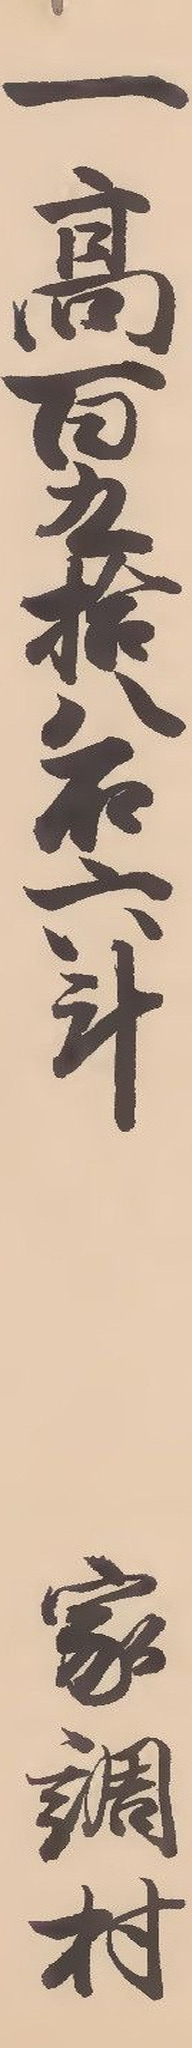一高百九拾八石六斗家調村

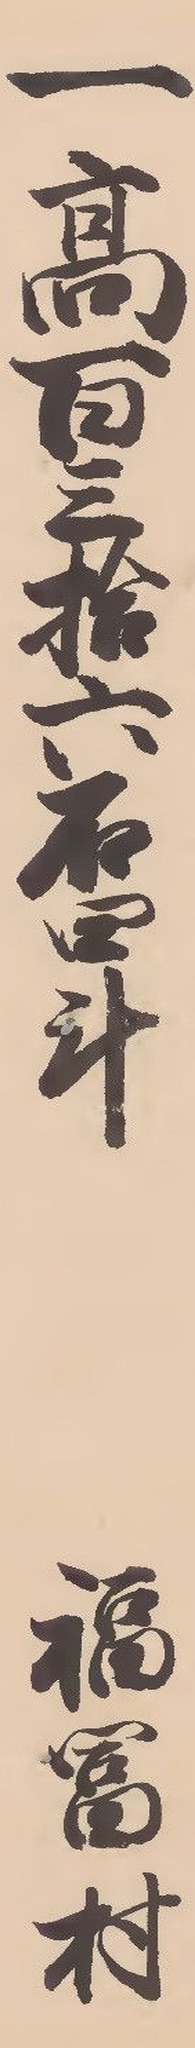一高百三拾六石四斗福冨村
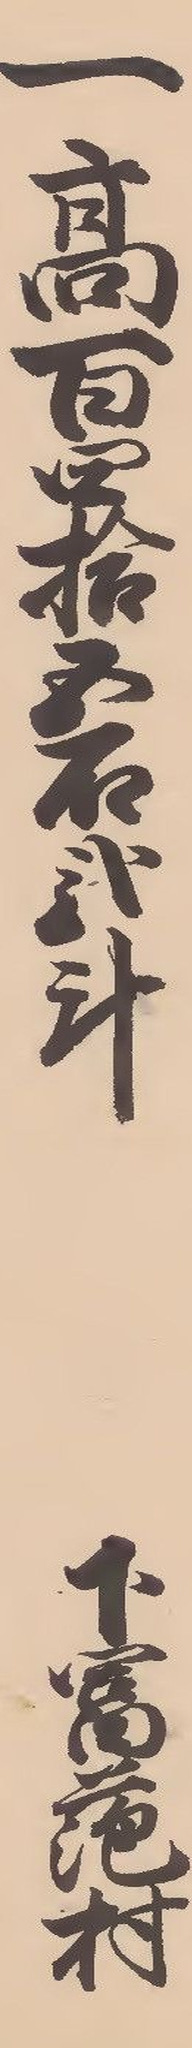一高百四拾五石弐斗下冨萢村
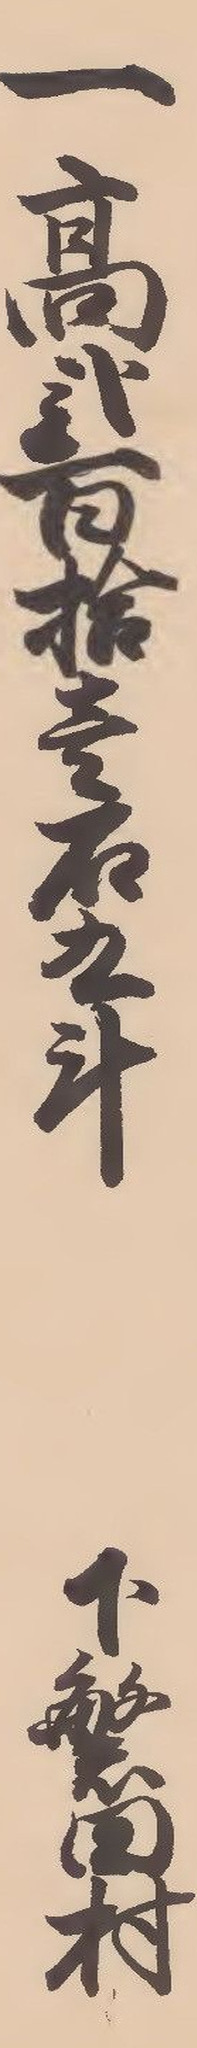一高弐百拾壱石九斗下繁田村
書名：陸奥国郷帳　７
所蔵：国立公文書館 National Archives of Japan
